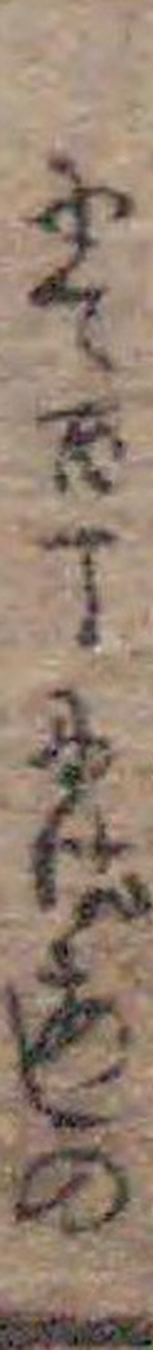にて百丁にげあしの
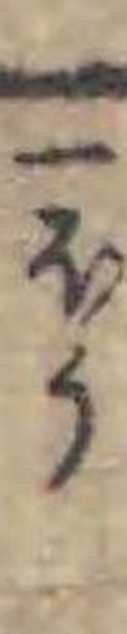一ほう
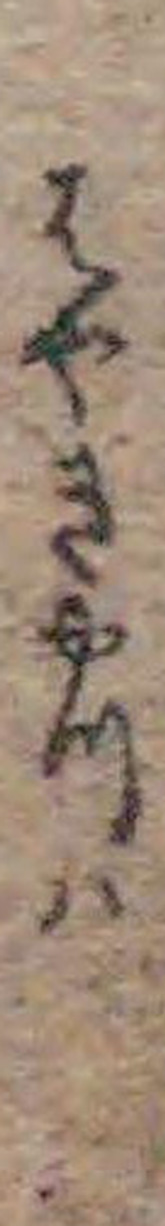はやきやつは
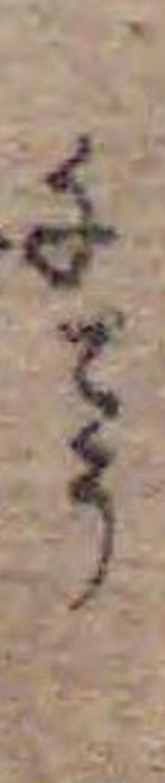千てう
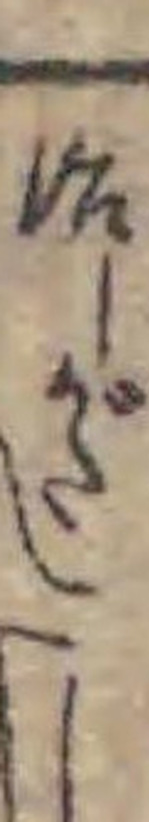治しがたし
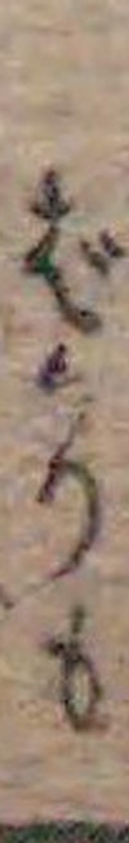ばかりも
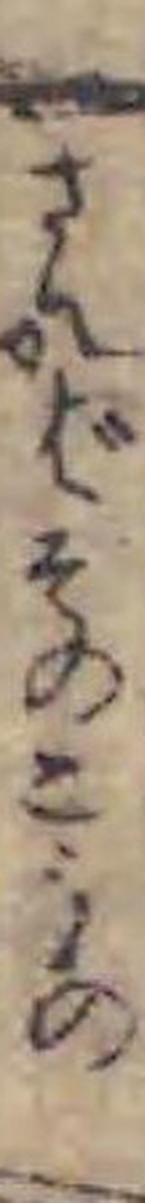さればそのこうの
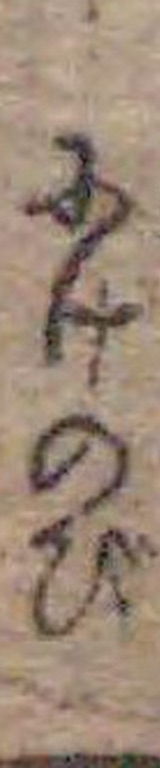にげのび
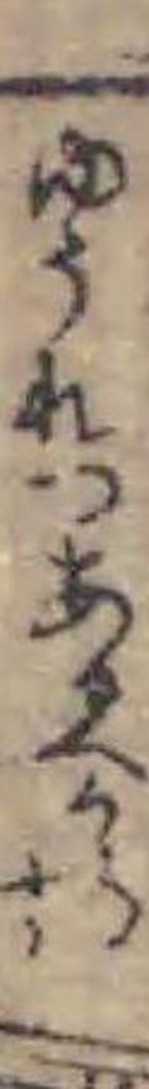ゆうれつあるへから
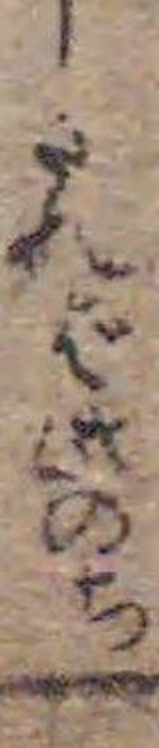されば此のち
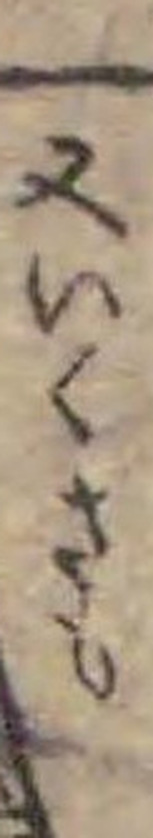又いくさも
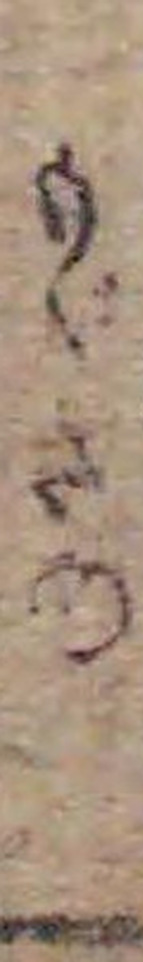もぐさの
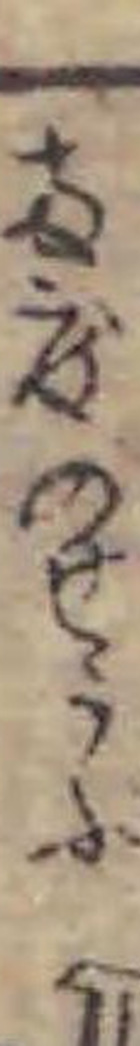両度のせうぶ
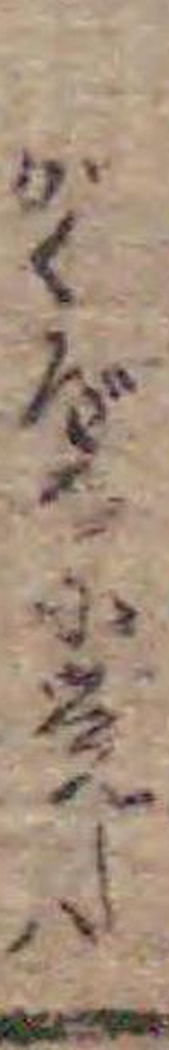かくべつに覚しは
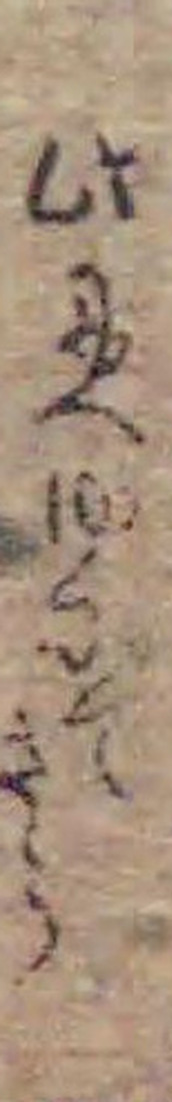此にへゆにて
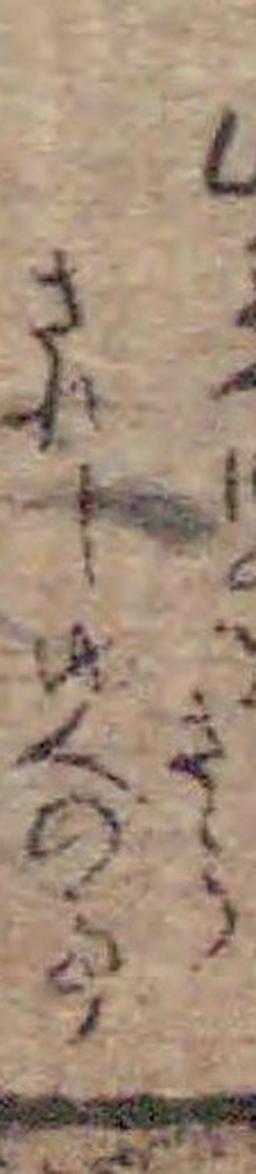されしゆへの事
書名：三舛増鱗組 : 3巻
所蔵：国立国会図書館 National Diet Library, JAPAN
